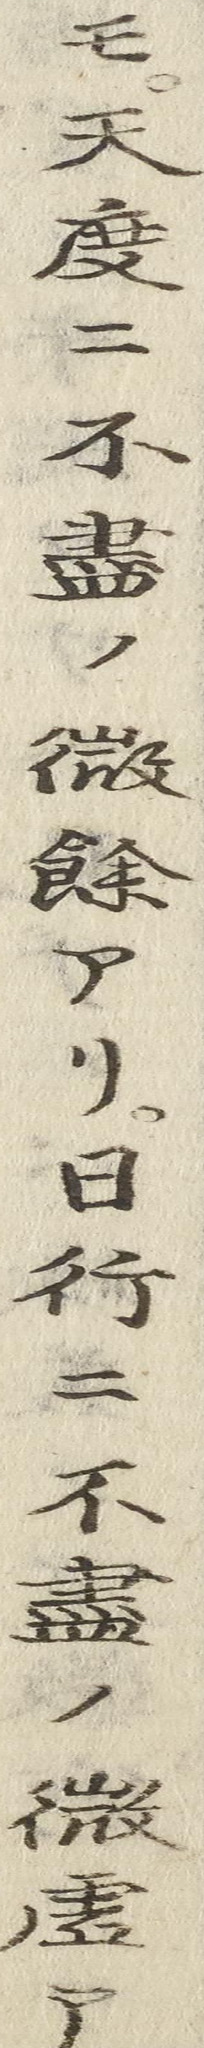モ。天度ニ不尽ノ微余アリ。日行ニ不尽ノ微虚ア
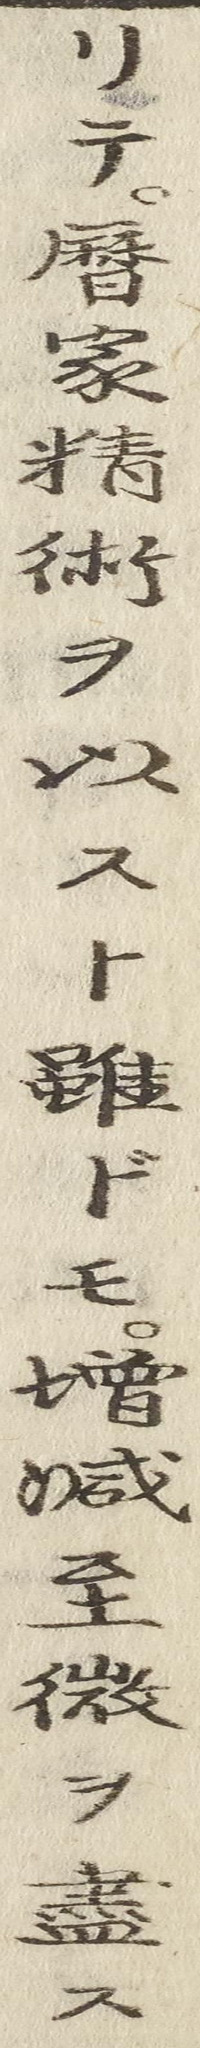リテ。暦家精術ヲ以スト雖ドモ。増減至微ヲ尽ス
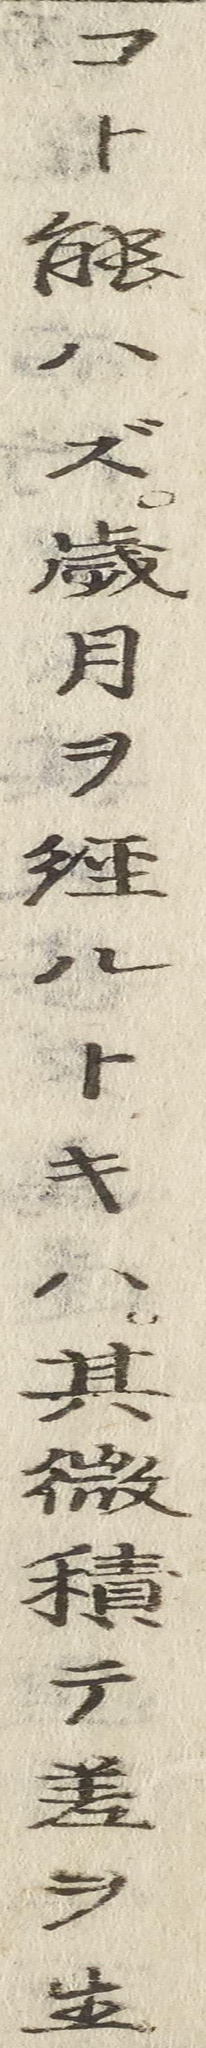コト能ハズ、歳月ヲ経ルトキハ。其微積テ差ヲ生
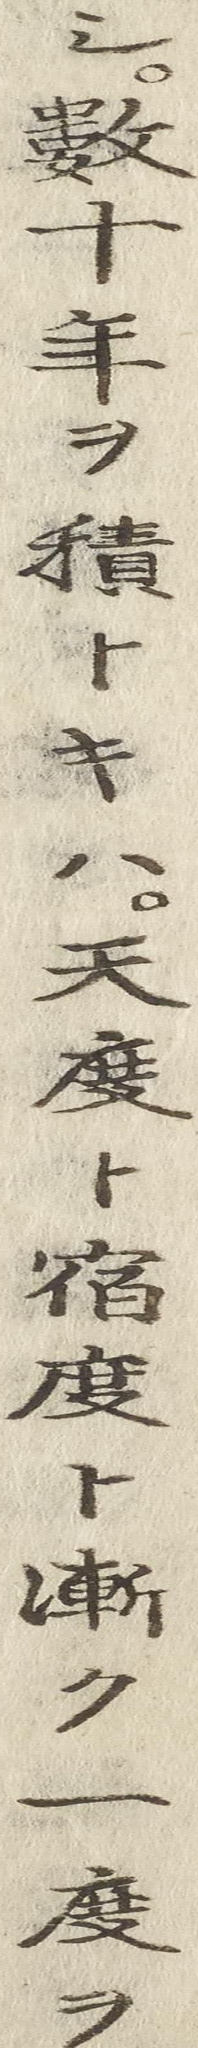シ。数十年ヲ積トキハ。天度ト宿度ト漸ク一度ヲ
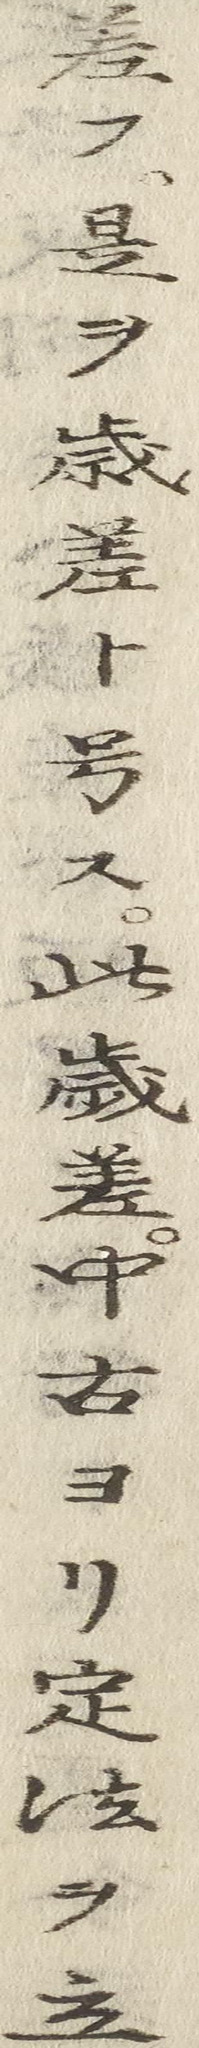差フ。是ヲ歳差ト号ス。此歳差。中古ヨリ定法ヲ立
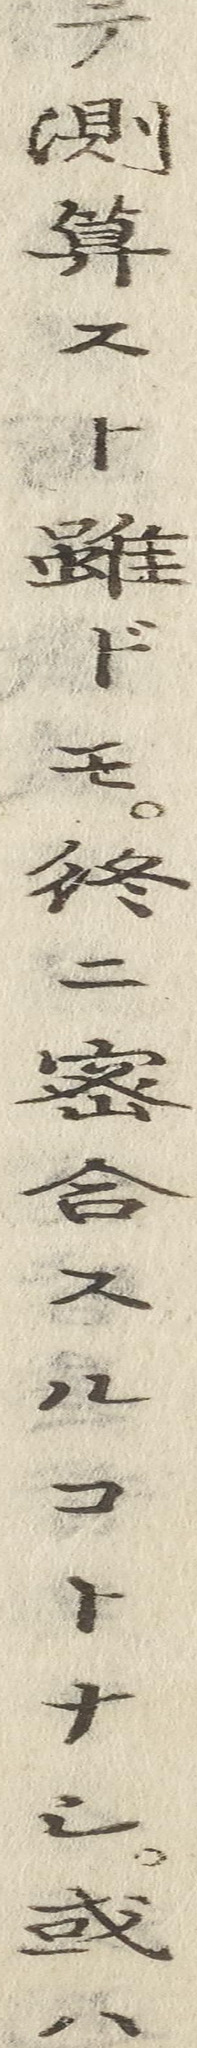テ測算スト雖ドモ。終ニ密合スルコトナシ。或ハ
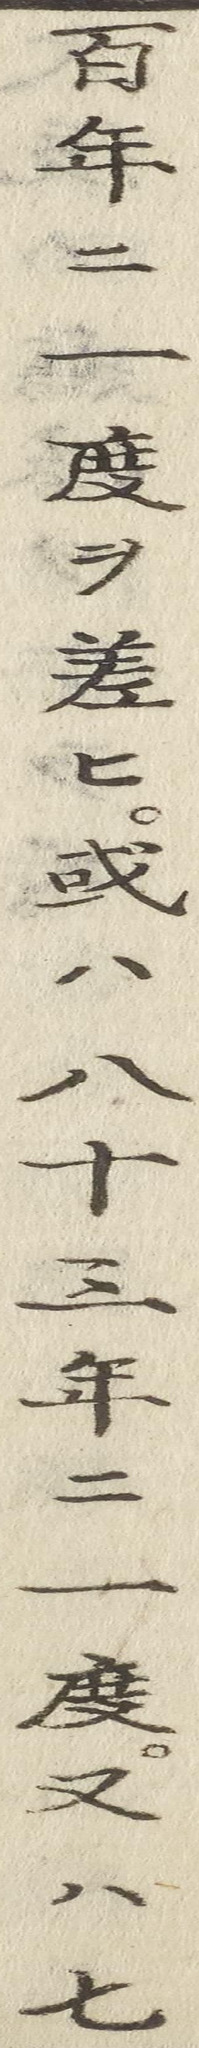百年ニ一度ヲ差ヒ。或ハ八十三年ニ一度。又ハ七
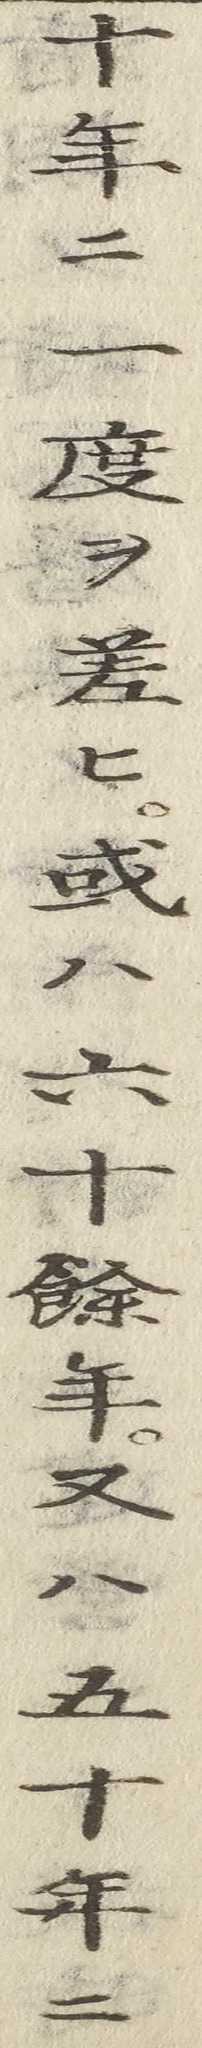十年ニ一度ヲ差ヒ。或ハ六十余年。又ハ五十年ニ
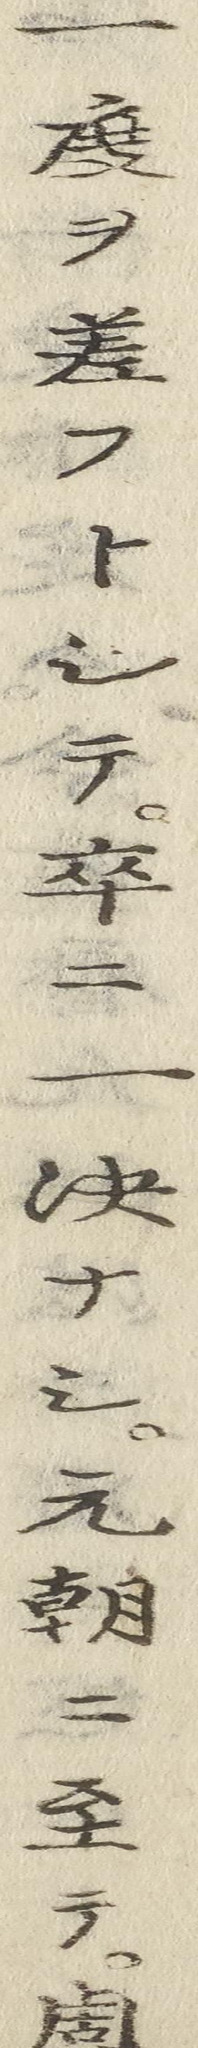一度ヲ差フトシテ。卒ニ一決ナシ。元朝ニ至テ。周
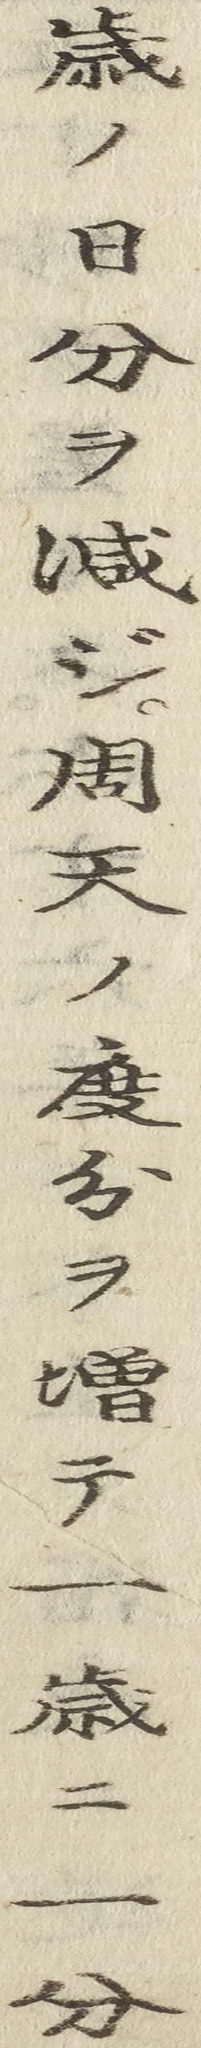歳ノ日分ヲ減ジ。周天ノ度分ヲ増テ一歳ニ一分

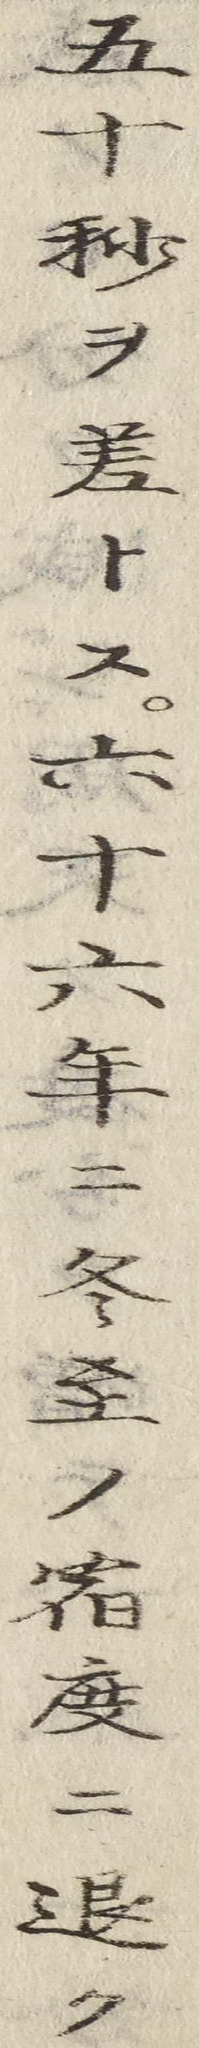五十秒ヲ差トス。六十六年ニ冬至ノ宿度ニ退ク
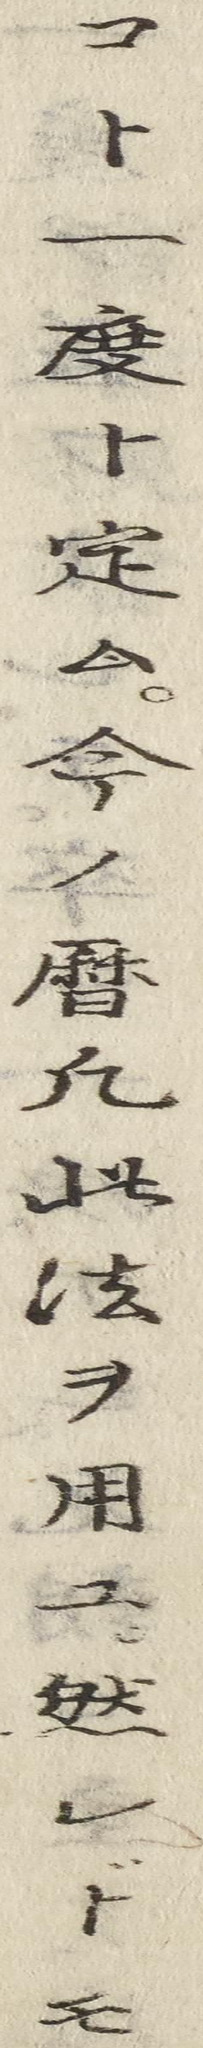コト一度ト定ム。今ノ暦凡此法ヲ用ユ。然レドモ
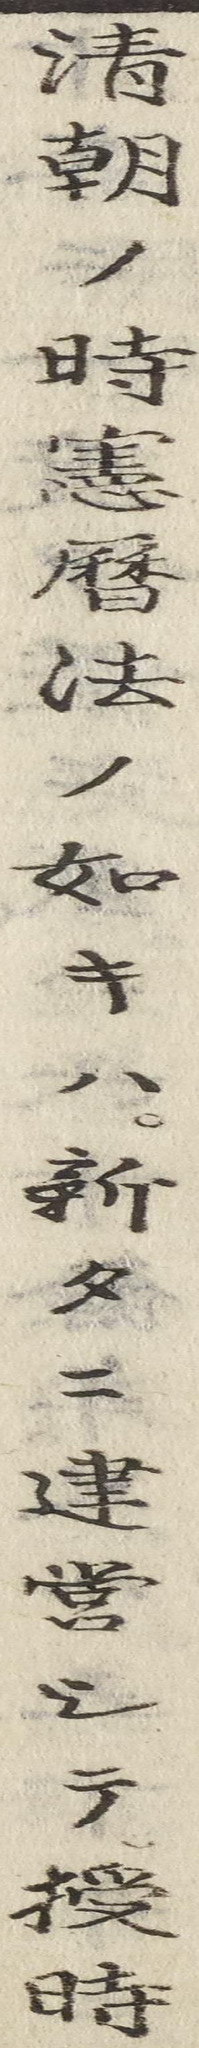清朝ノ時憲暦法ノ如キハ。新タニ建営シテ授時
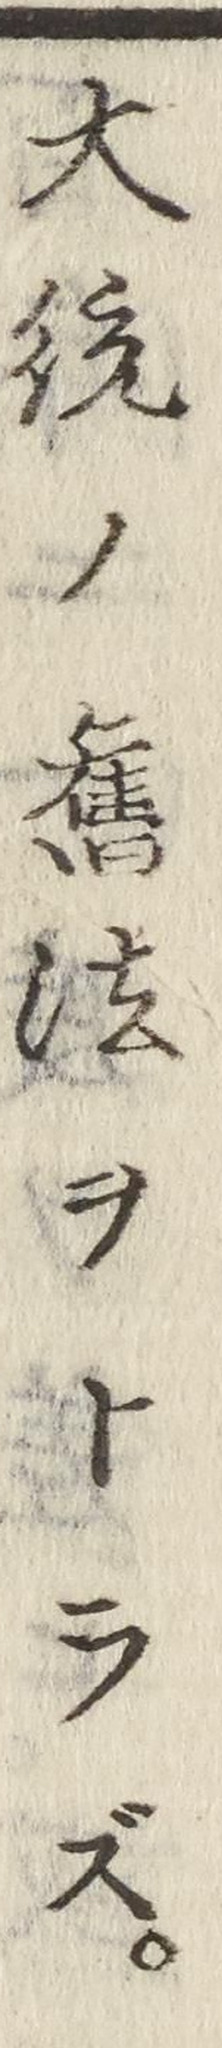大統ノ旧法ヲトラズ。
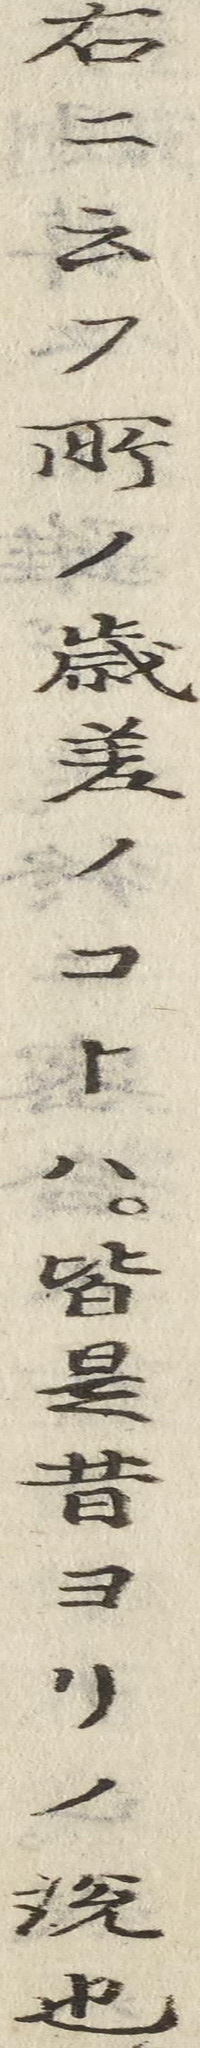右ニ云フ所ノ歳差ノコトハ。皆是昔ヨリノ説也。
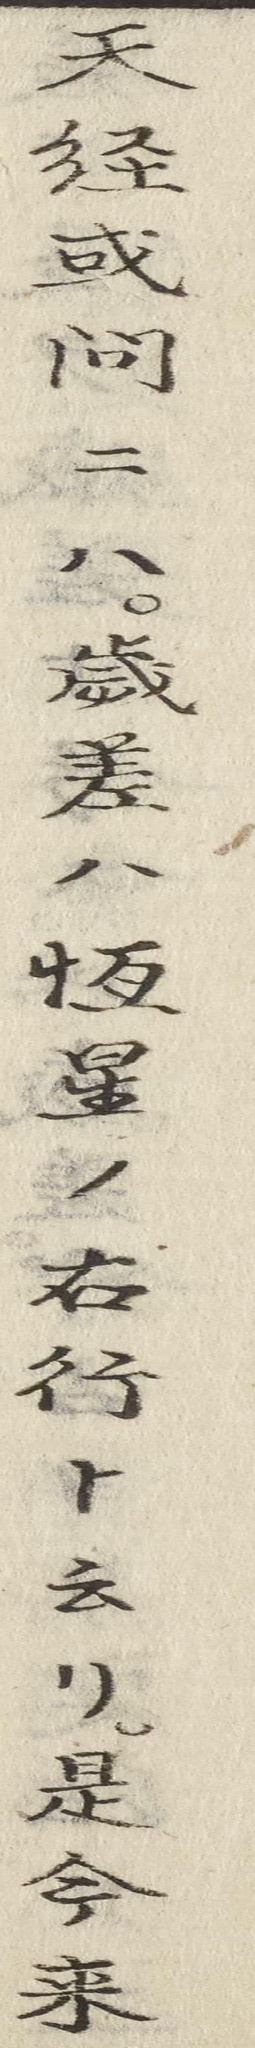天経或問ニハ。歳差ハ恒星ノ右行ト云リ。是今来
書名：大略天学名目鈔　天經或問附録
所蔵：東京大学地震研究所図書室 Earthquake Research Institute Library, The University of Tokyo, JAPAN
